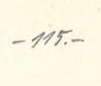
115
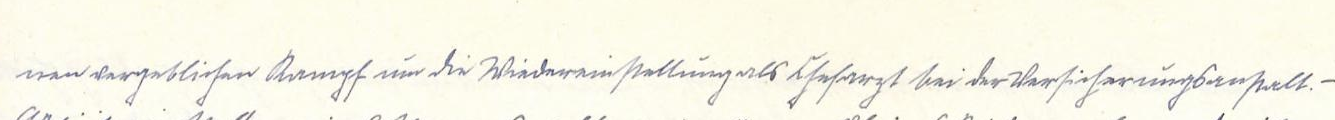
nen vergeblichen Kampf um die Wiedereinstellung als Chefarzt bei der Versicherungsanstalt.-
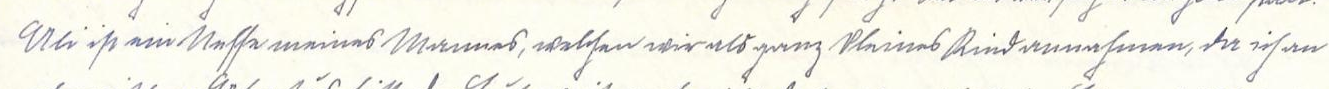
Alois ist ein Neffe meines Mannes, welchen wir als ganz kleines Kind annahmen, da ich an
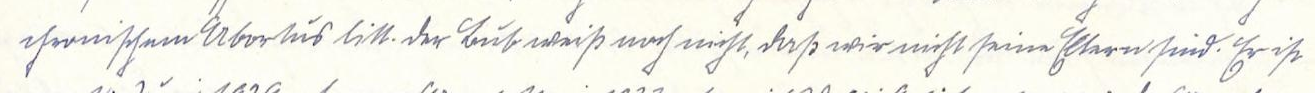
chronischem Abortus litt. Der Bub weiß noch nicht, daß wir nicht seine Eltern sind. Er ist
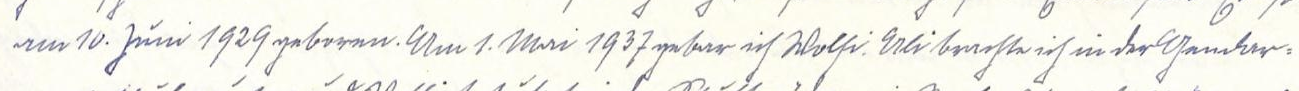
am 10. Juni 1929 geboren. Am 1. Mai 1937 gebar ich Wolfi. Ali brachte ich in der Gendar-
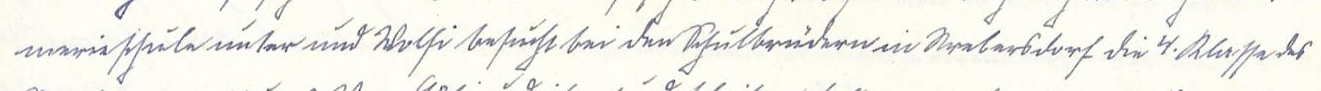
merieschule unter und Wolfi besucht bei den Schulbrüdern in Strelersdorf die 4. Klasse des
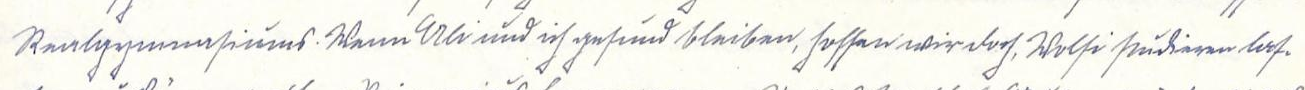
Realgymnasiums. Wenn Ali und ich gesund bleiben, hoffen wir doch, Wolfi studieren las-
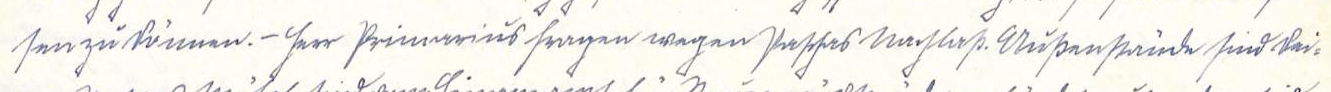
sen zu können. - Herr Primarius fragen wegen Paschas Nachlaß. Außenstände sind kei-
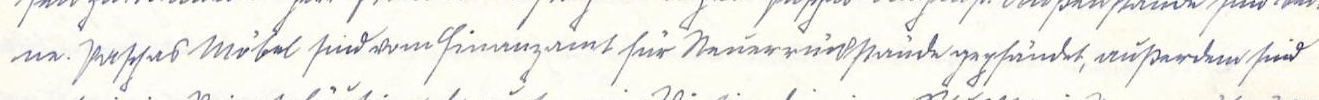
ne. Paschas Möbel sind vom Finanzamt für Steuerrückstande gepfändet außerdem sind
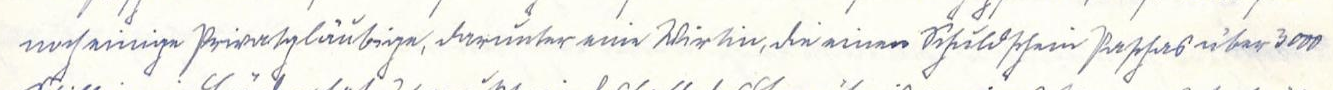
noch einige Privatgläubiger, darunter eine Wirtin, die einen Sohuldschein Paschas über 3000
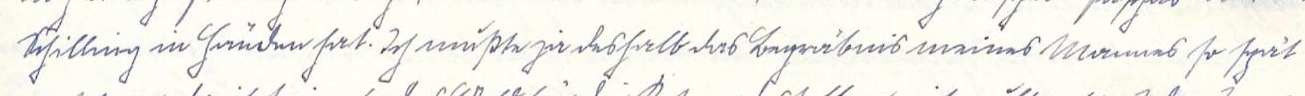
Schilling im Händen hat. Ich musste ja deshalb das Begräbnis meines Mannes so spät
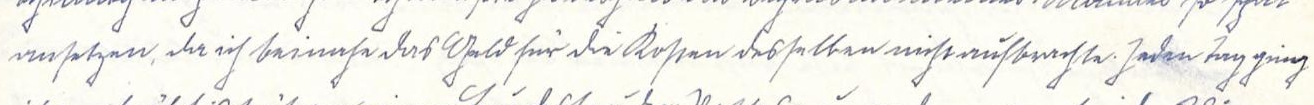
ansetzen, da ich beinahe das Geld für die Kosten desselben nicht aufbrachte. Jeden Tag ging
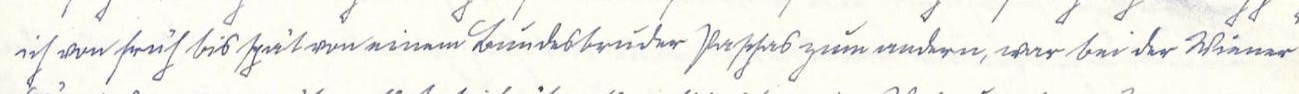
ich von früh bis spät von einem Bundesbruder Paschas zum anderen, war bei der Wiener
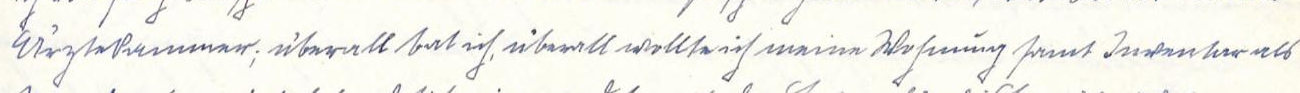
Ärztekammer; überall bat ich, überall wollte ich meine Wohnung stammt Inventer als
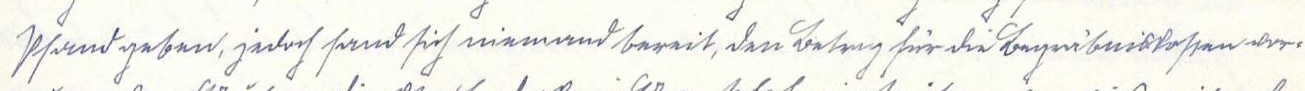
Pfand geben, jedoch fand sich niemand bereit, den Beitrag für die Begräbniskosten vor-
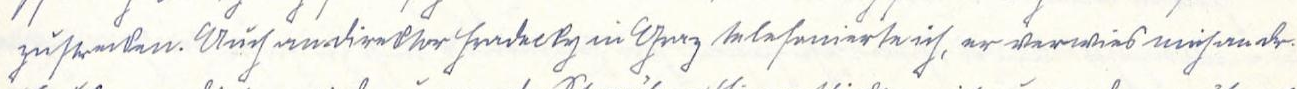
zustrecken. Auch an Direktor Hradecky in Graz telefenierte ich, er verwies mich an Dr.
